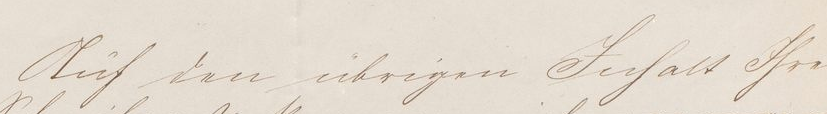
Auf den übrigen Inhalt Ihres
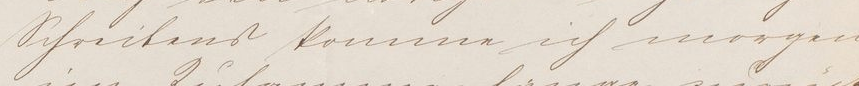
Schreibens komme ich morgen
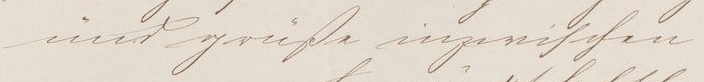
und grüße inzwischen
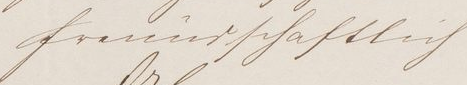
freundschaftlich
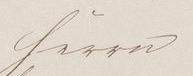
Herrn
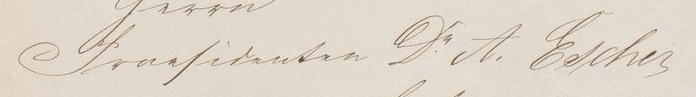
Praesidenten Dr A. Escher
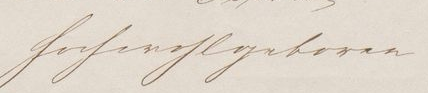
hochwohlgeboren
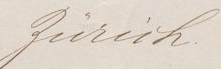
Zürich.
